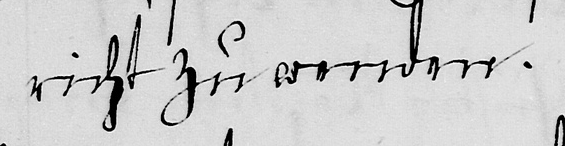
richt zu wenden.
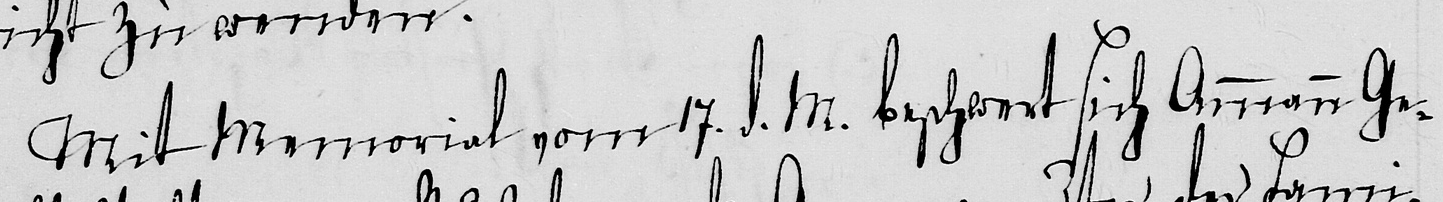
Mit Memorial vom 17. d. M. beschwert sich Ammann Ge¬
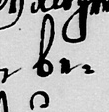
eine
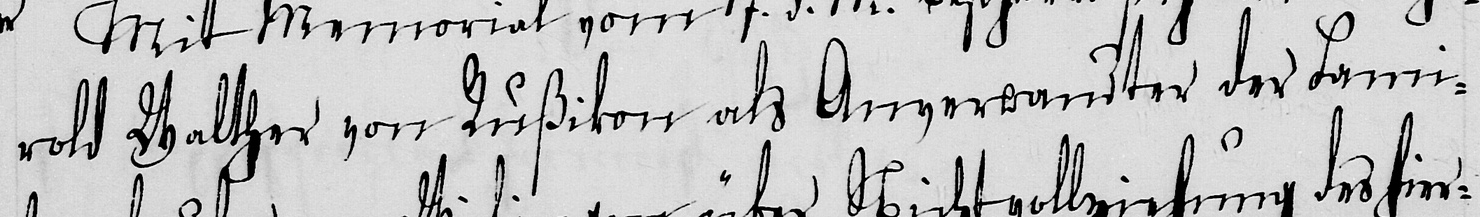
rold Walther von Rußikon als Anverwandter der Fami¬
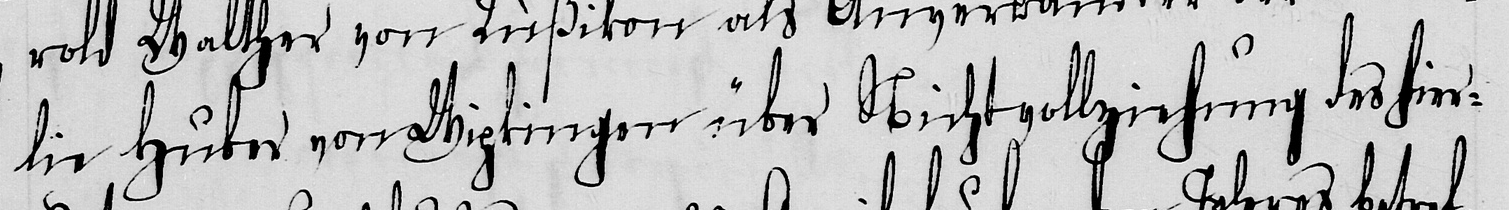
lie Huber von Wipkingen über Nichtvollziehung des hier¬
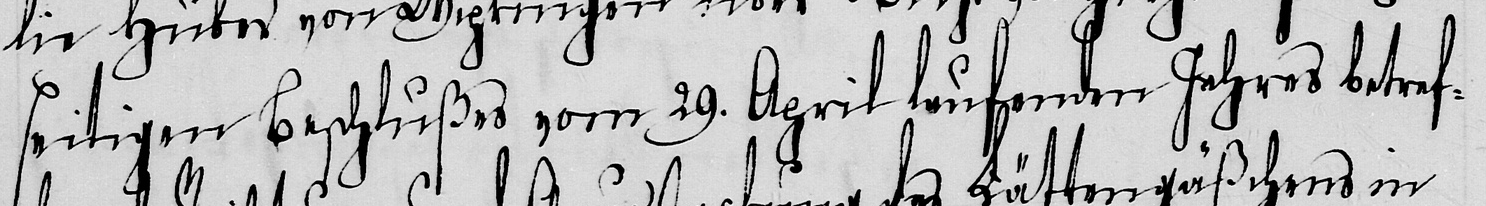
seitigen Beschlußes vom 29. April laufenden Jahres betref¬
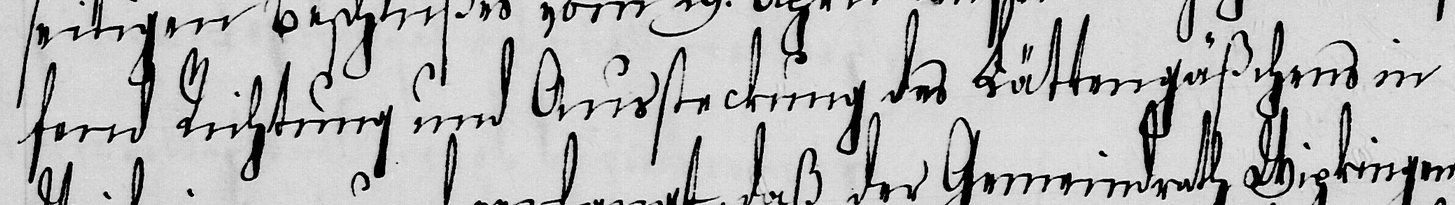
fend Richtung und Aussteckung des Lättengäßchens in
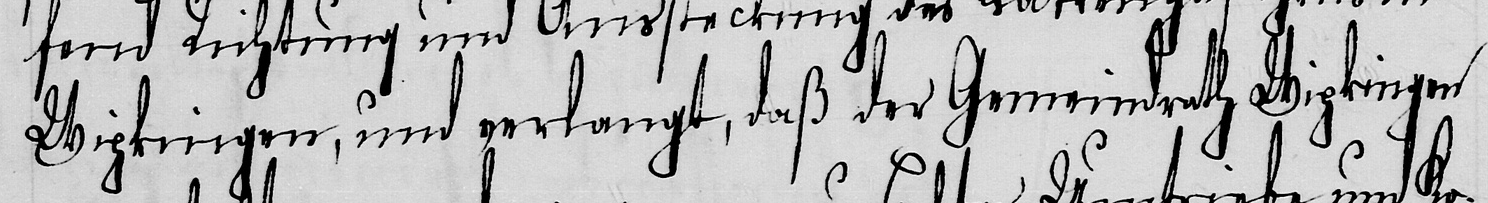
Wipkingen, und verlangt, daß der Gemeindrath Wipkingen
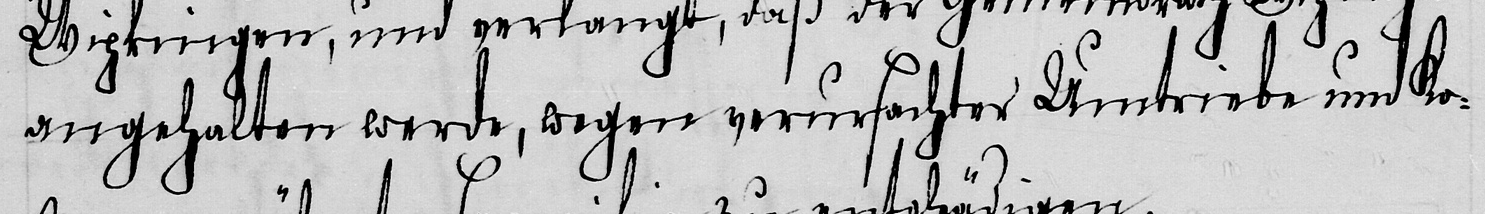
angehalten werde, wegen verursachter Umtriebe und Ko¬
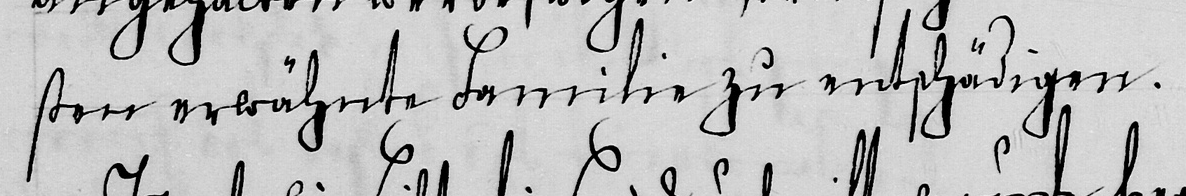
sten erwähnte Familie zu entschädigen.
